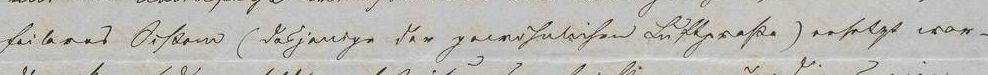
feileres Sistem (dasjenige der gewöhnlichen Luftpreße) ersetzt wor-
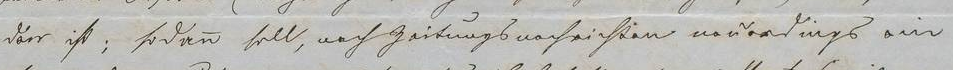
den ist; sodann soll, nach Zeitungsnachrichten neuerdings ein
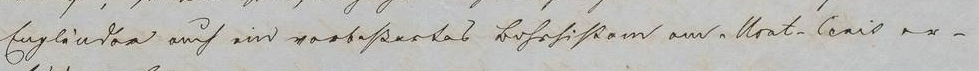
Engländer auch ein verbeßertes Bohrsistem am Mont-Cenis er-
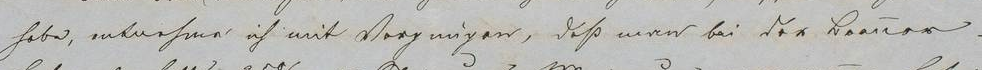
habe, entnehme ich mit Vergnügen, daß man bei der Brenner-
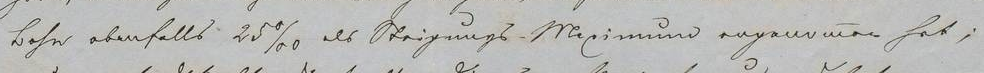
Bahn ebenfalls 25‰ als Steigungs-Maximum angenommen hat;
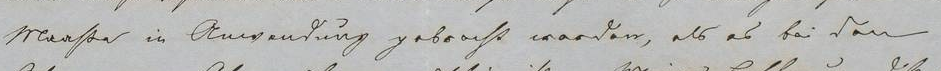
Maaße in Anwendung gebracht werden, als es bei den
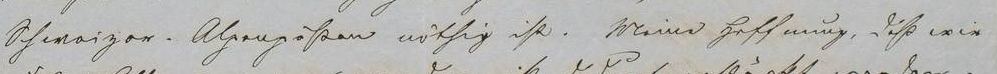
Schweizer. Alpenpäßen nöthig ist. Meine Hoffnung, daß wir
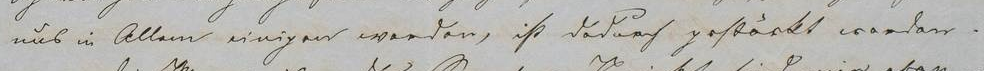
uns in Allem einigen werden, ist dadurch gestärkt worden.
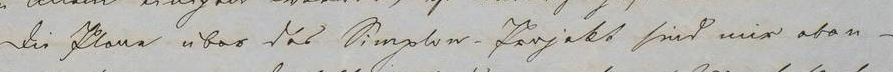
Die Plane über das Simplon-Projekt sind mir eben-
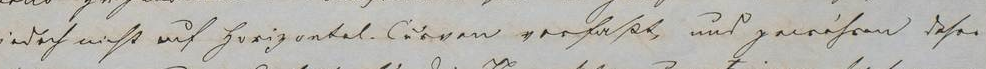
jedoch nicht auf Horizontal-Curven verfaßt, und gewähren daher
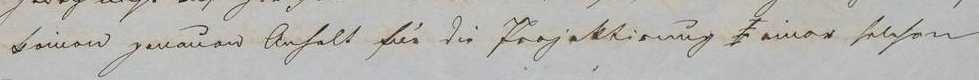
keinen genauen Anhalt für die Projektirung s einer solchen
